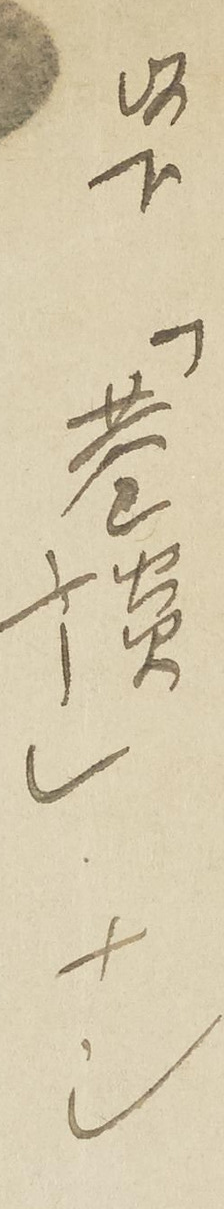以下「巷談」ナシ

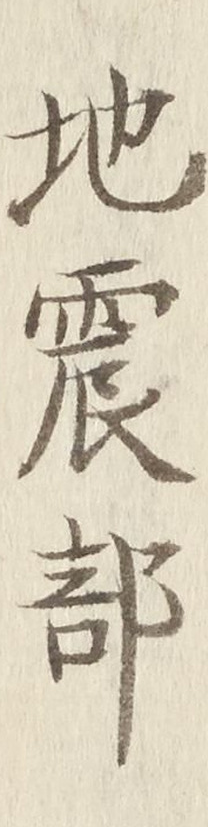地震部
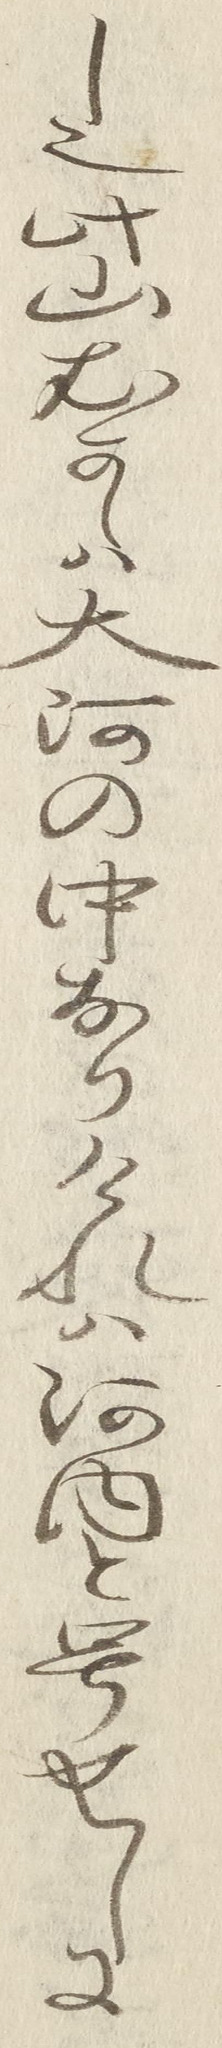し也此山むかしは大河の中なりけれは河内と号せしに
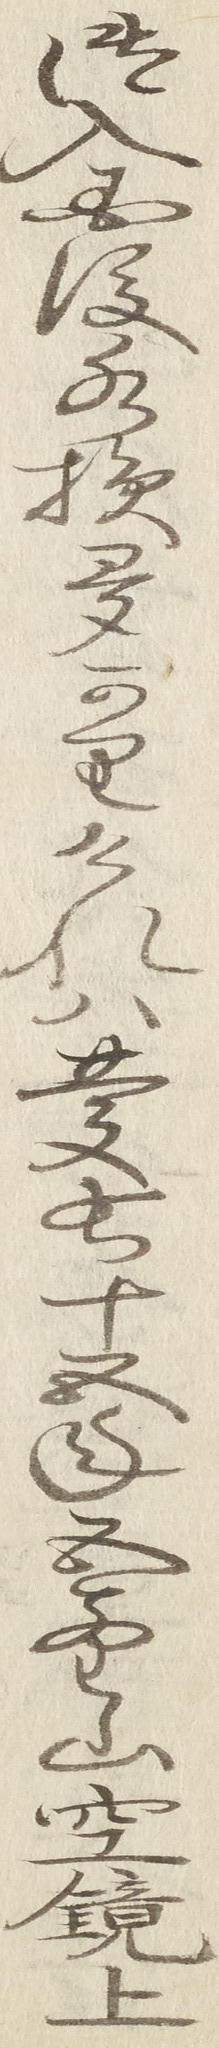御入国後水損多かりけれは慶長十五年五台山空鏡上
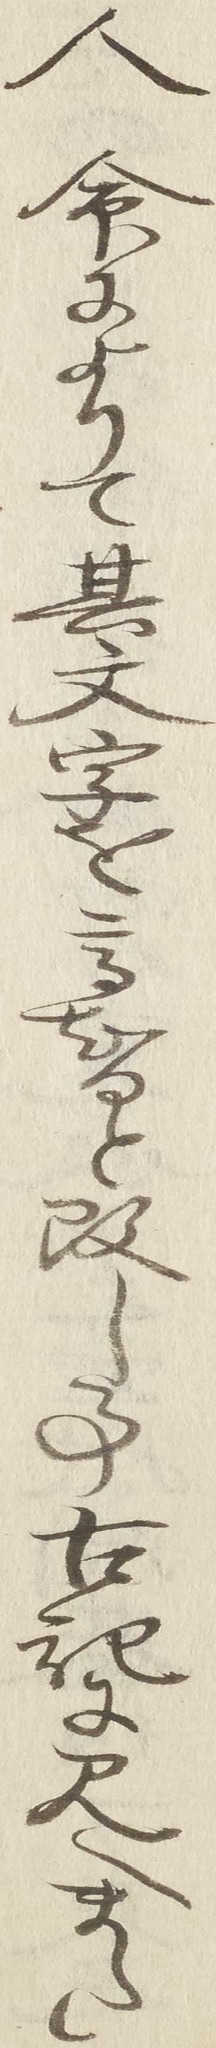人命によりて其文字を高智と改し事古記に見へまた
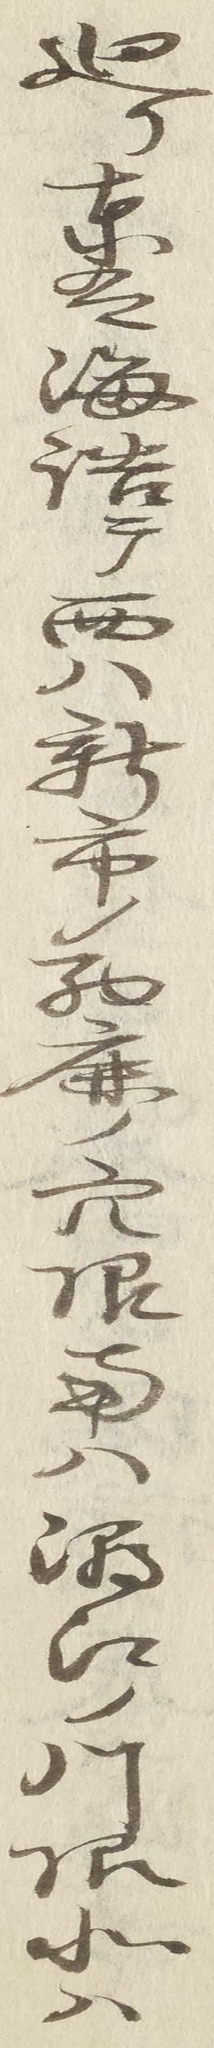廻り東は海詰テ西は新市ノ西鹿ノ穴限南は潮江ノ川限北は
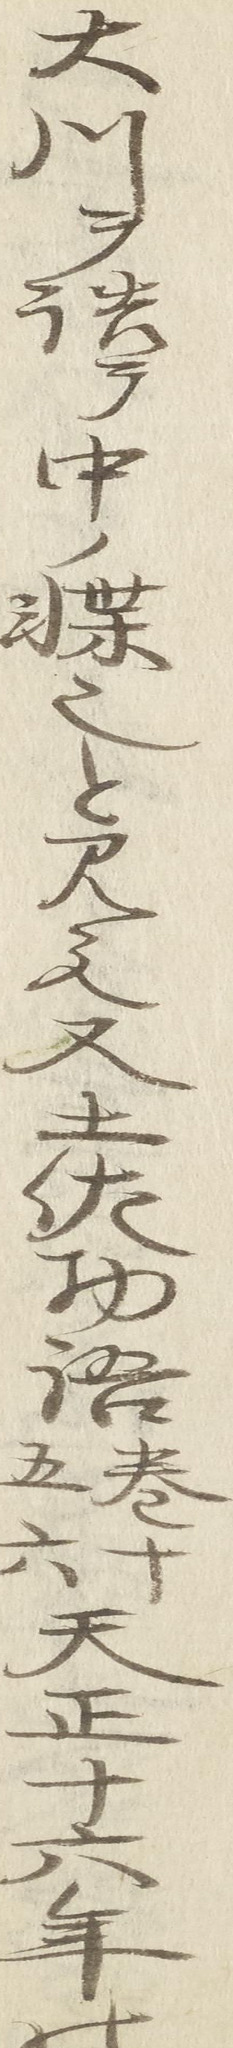大川ヲ詰テ中ノ牒也と見え又土佐物語巻十五六天正十六年の
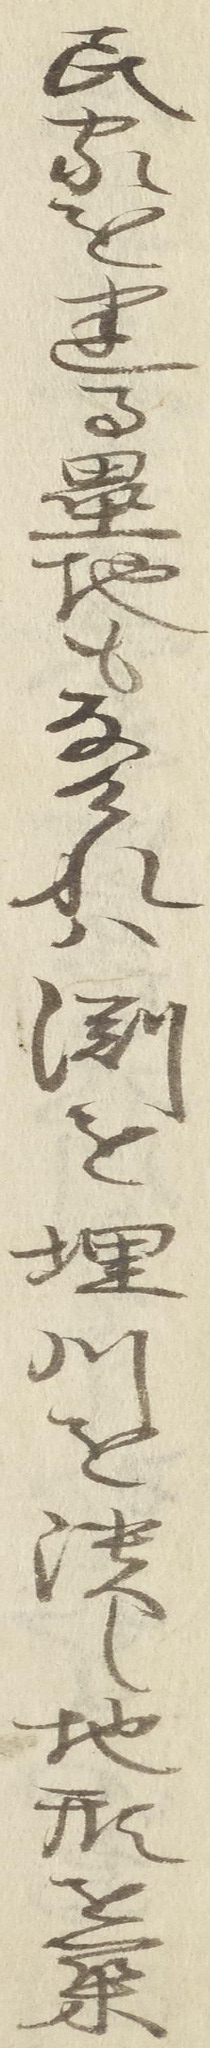民家を建る塁地もなけれは渕を埋川を潰し地形を築

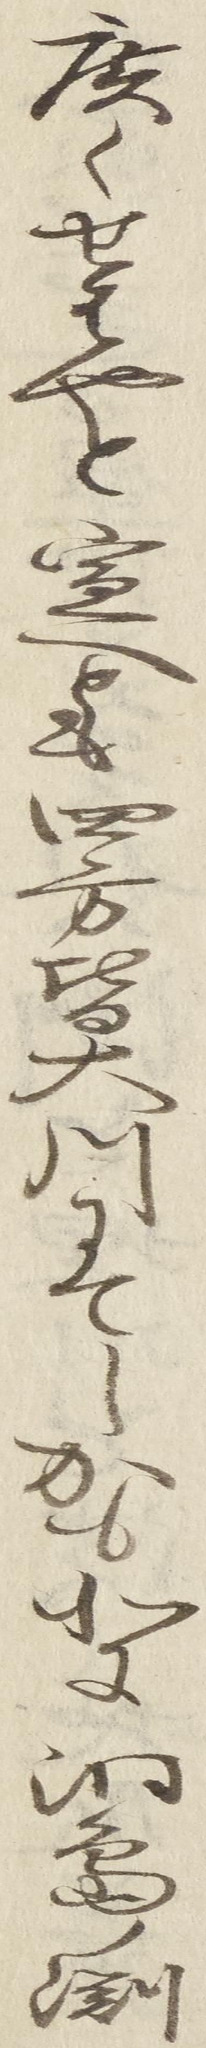広くせはやと宣へとも四方皆大川にてしかも北に洞島ノ渕
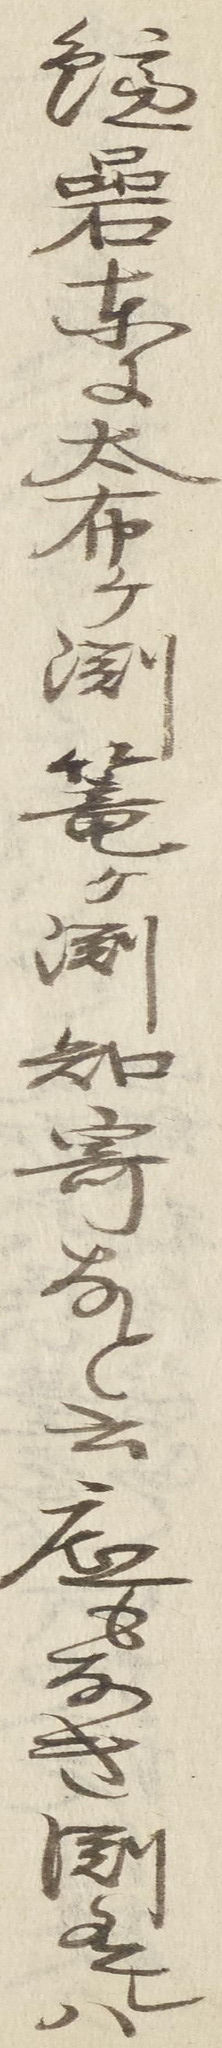鱸碞東に太布ヶ渕篭ヶ渕知寄なと云底もなき渕有レは
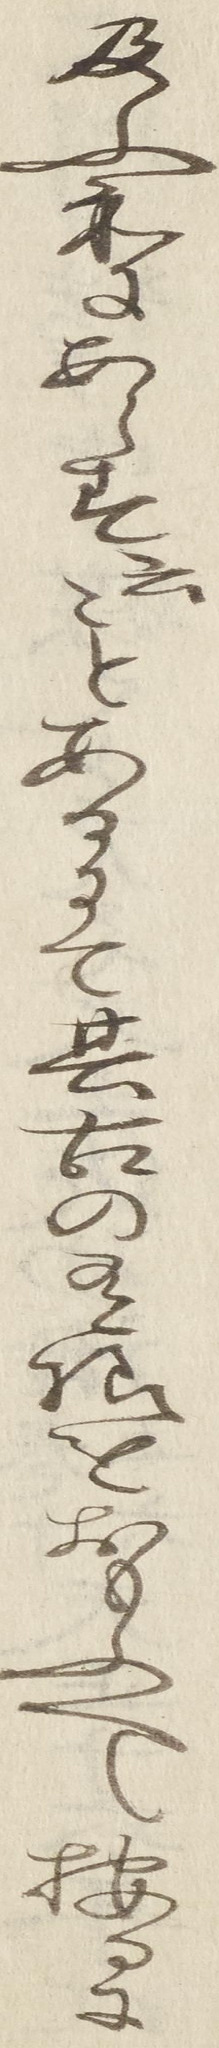及ふ所にあらす云ことあるにて其古の有様をおもふへし按るに
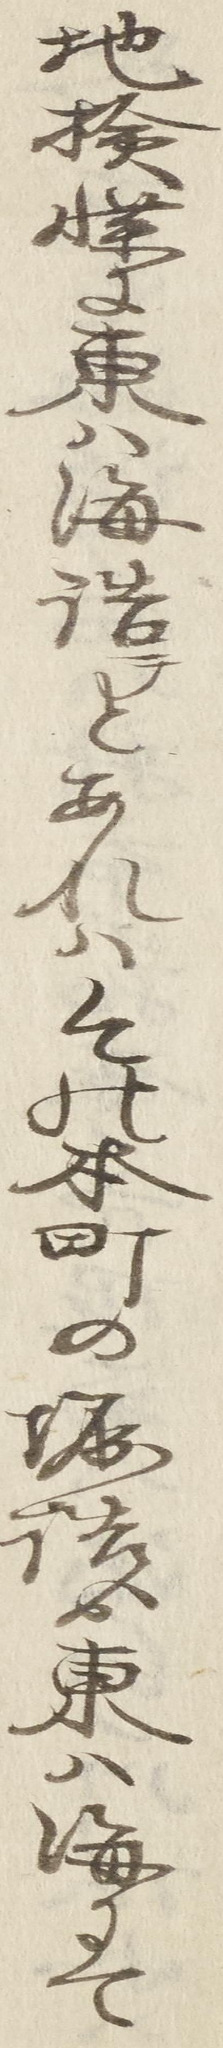地検帳に東は海詰テとあれは今の本町の堀詰ゟ東は海にて
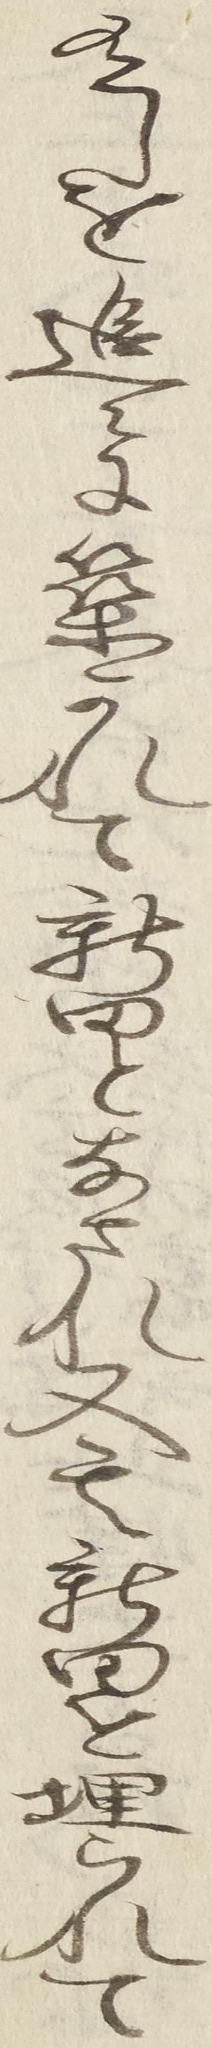有しを追々に築かれて新田となされ又其新田を埋られて
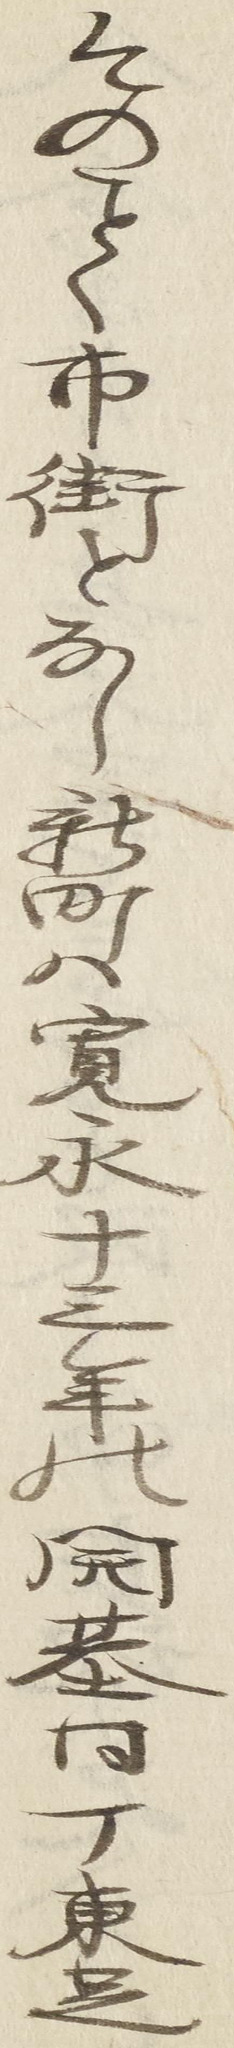今のことく市街となし新町は寛永十三年の開基同丁東足
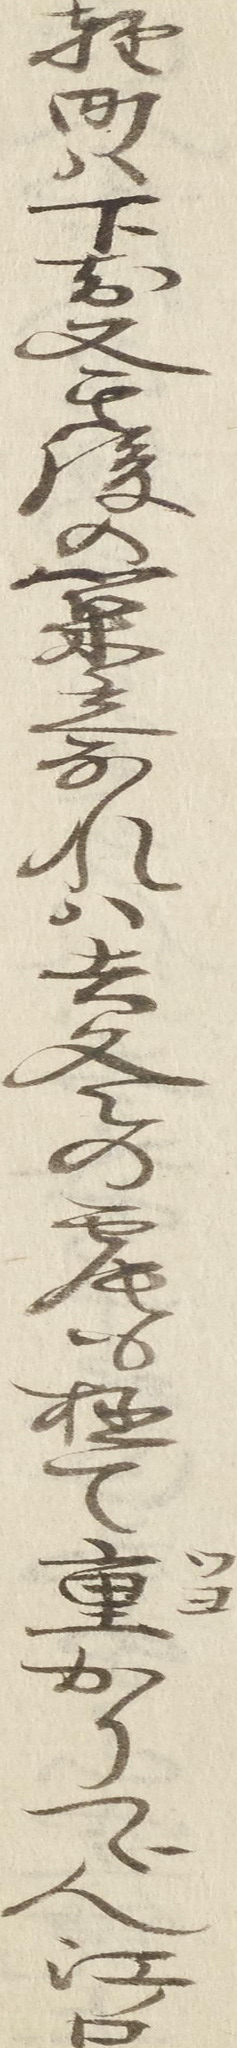軽町は下知又其後の築立なれは去冬の震も極て重かりつゞく江ノ口
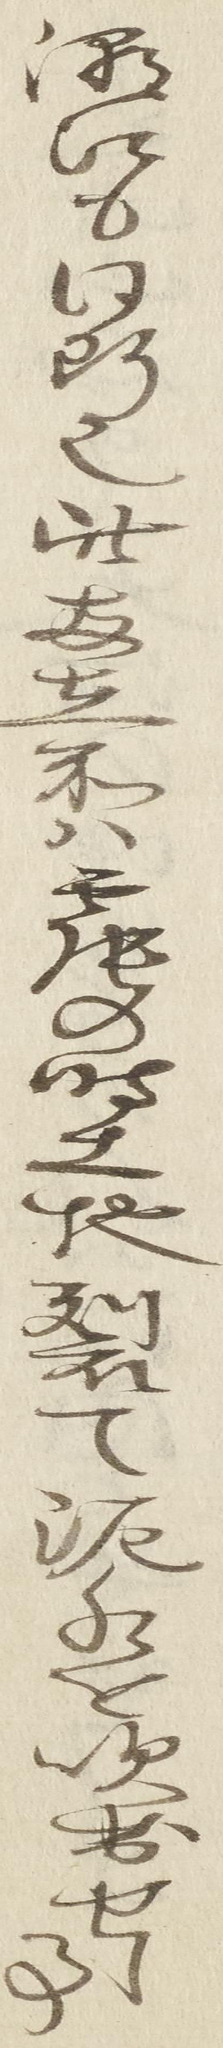潮江も同断也此両在所は震の時地裂て泥水を吹出せし事
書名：地震記　上
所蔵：東京大学地震研究所図書室 Earthquake Research Institute Library, The University of Tokyo, JAPAN
